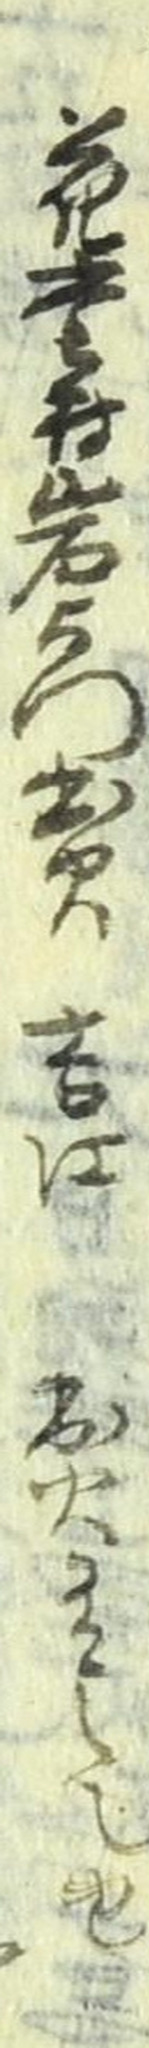花堂村岩与門出火吉江出火有之候由
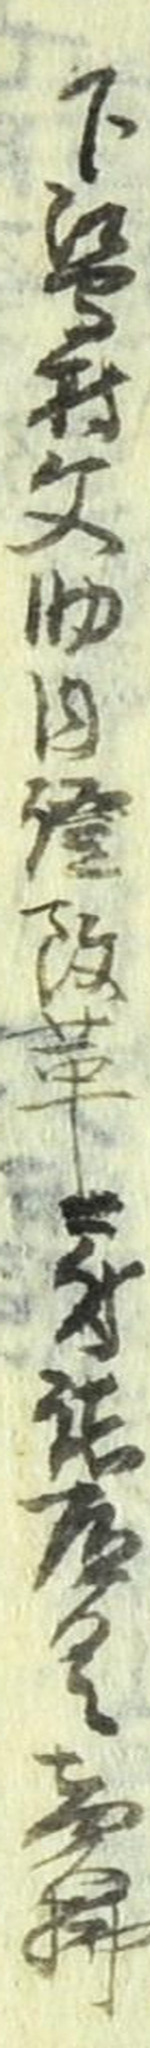下江守村文助内証改革ニ付諸道具売払
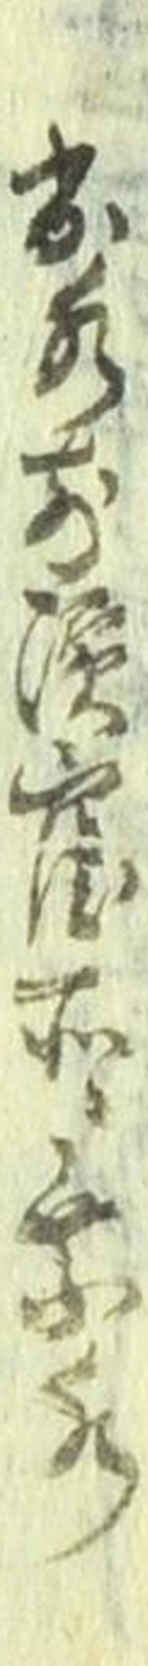出水前浜窪所々乗水
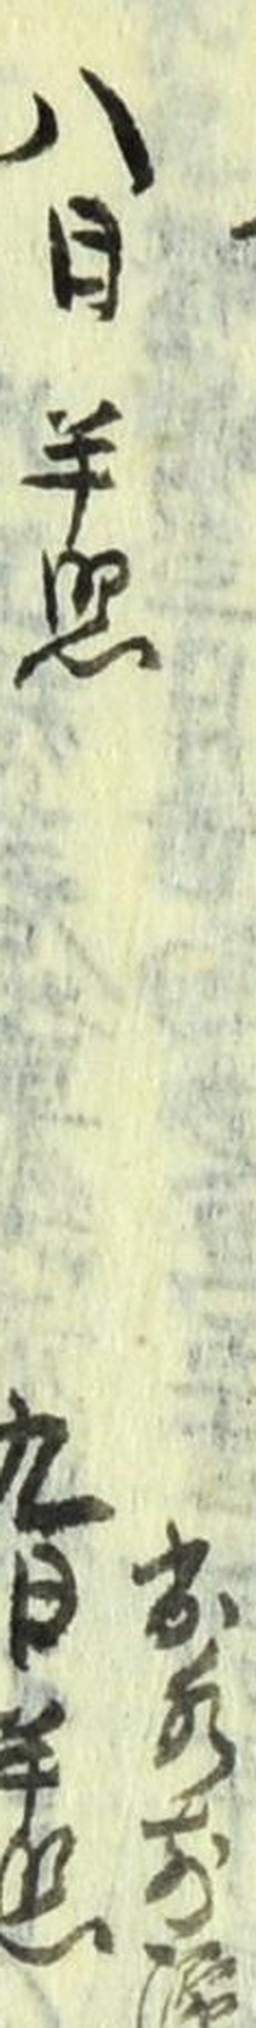八日半照九日半照
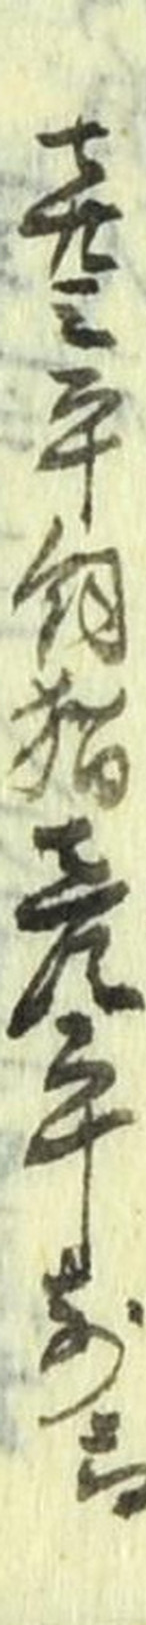喜三平飼猫彦平前ニ而
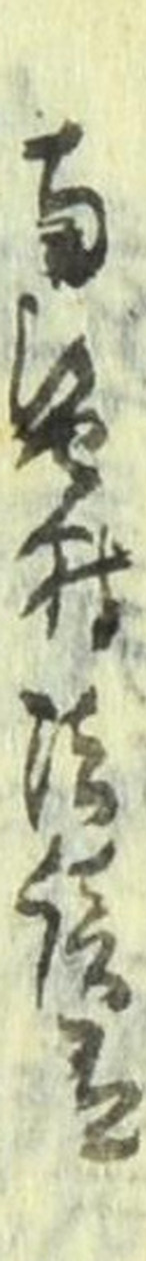南江守村法談有
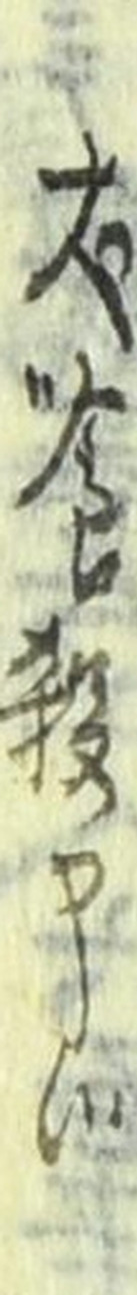犬喰殺申候
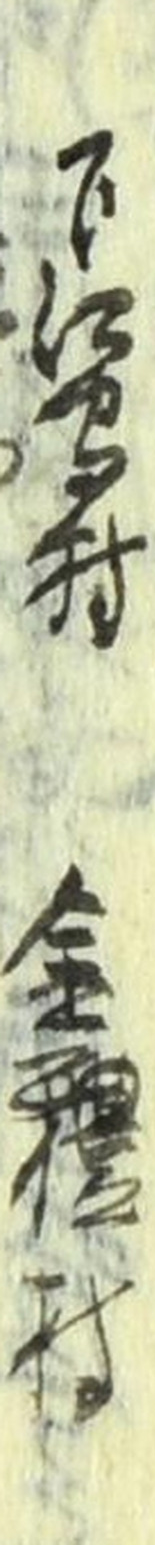下江守村金糟村
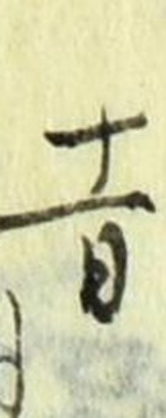十一日
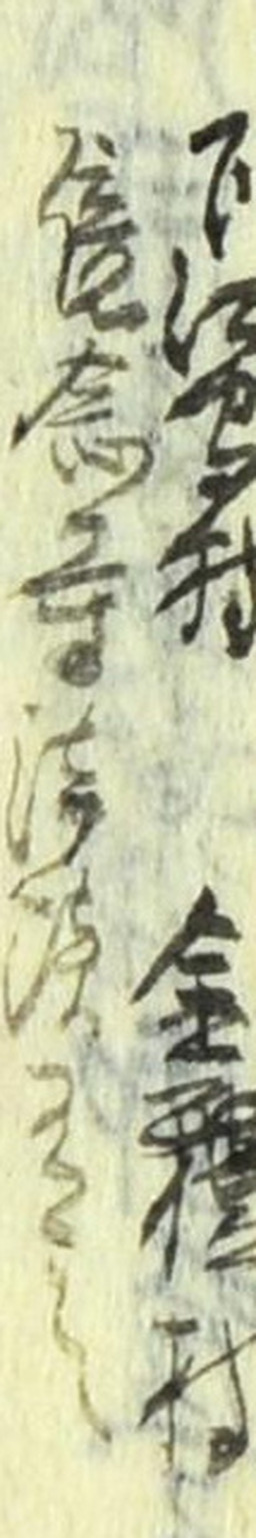億念寺法談有之
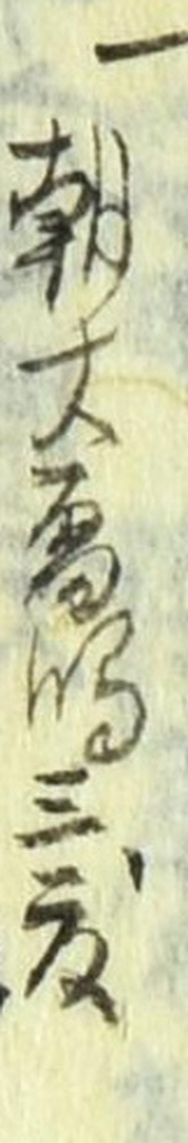朝大雷鳴三度
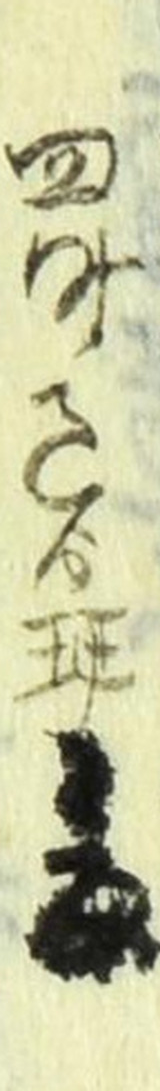四時過ゟ班々雨
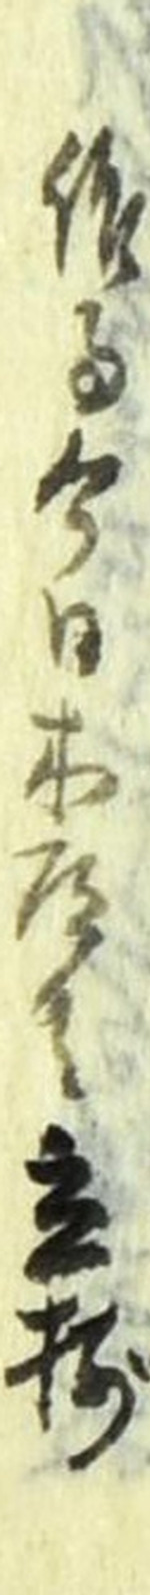作る今日木道具立揃

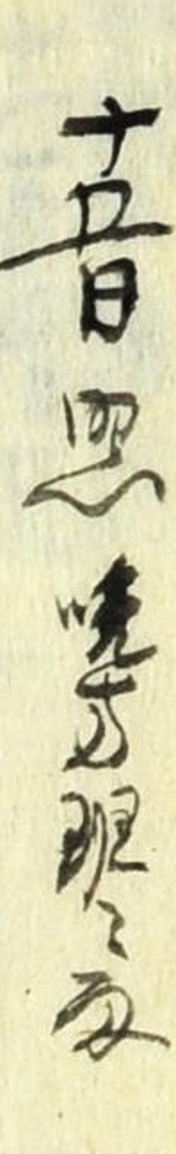十五日照晩方班々雨
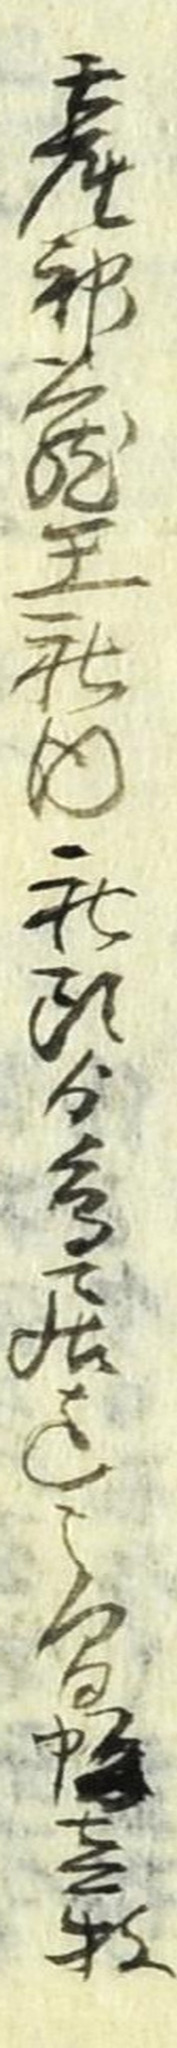産神蔵王社内社頭ゟ鳥居迄之間幅壱枚
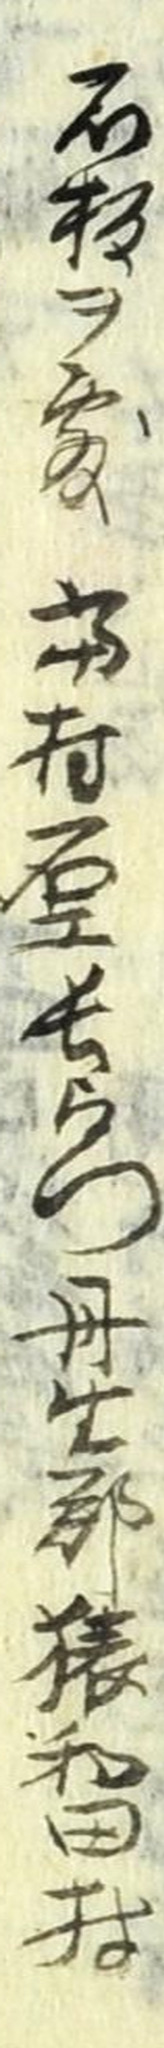石板ヲ敷当村石工長与門丹生郡猿和田村
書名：（日記）
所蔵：福井県文書館 Fukui Prefectural Archives
